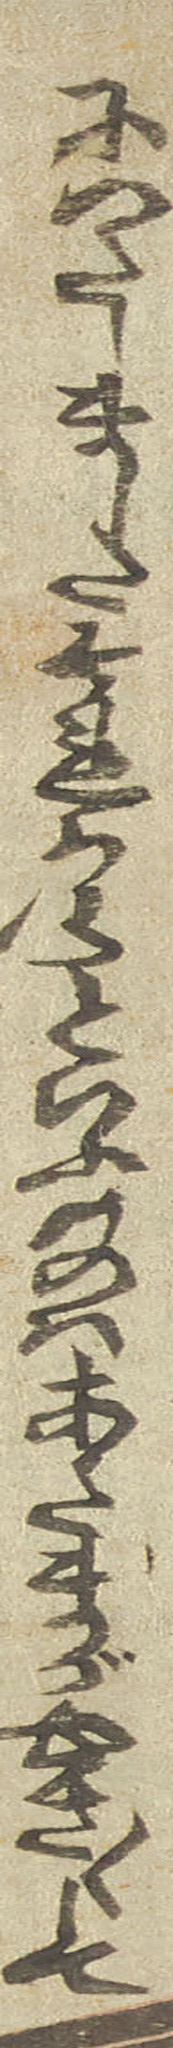にいたしましたそれからといふものはあたまがゆさ〳〵して
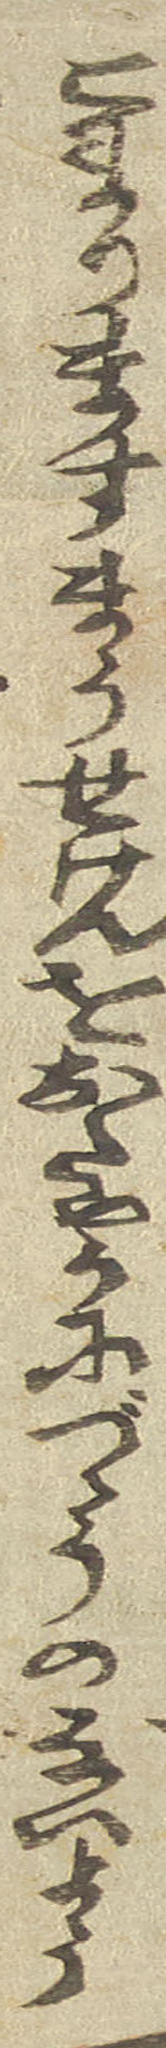こまりますまうせけんをおたやかにづゝうのないよう
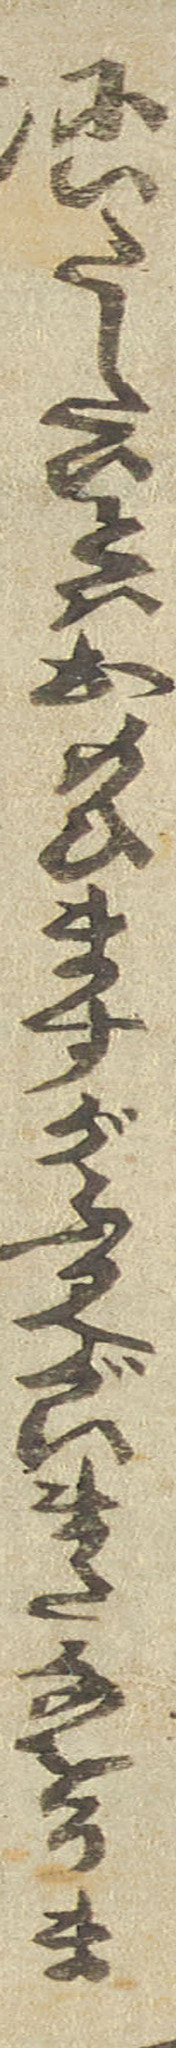にいたしたいとはおもひますがふるへがいまたなをりま
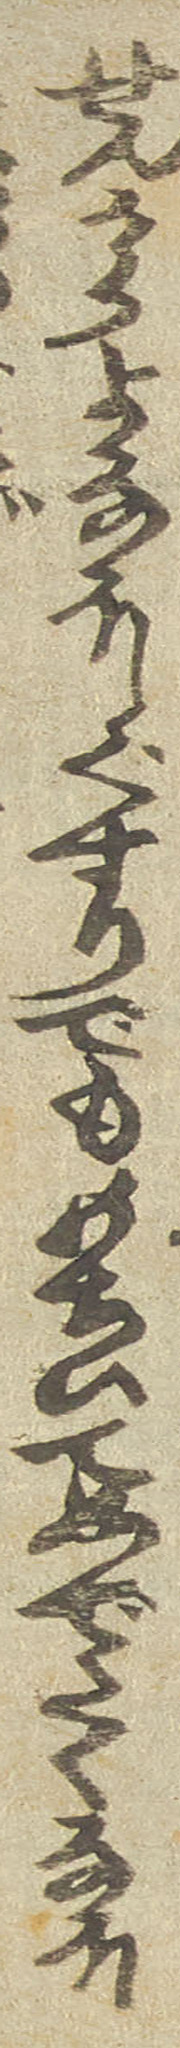せんからよなほしぐすりでももちいてめでたくなほし
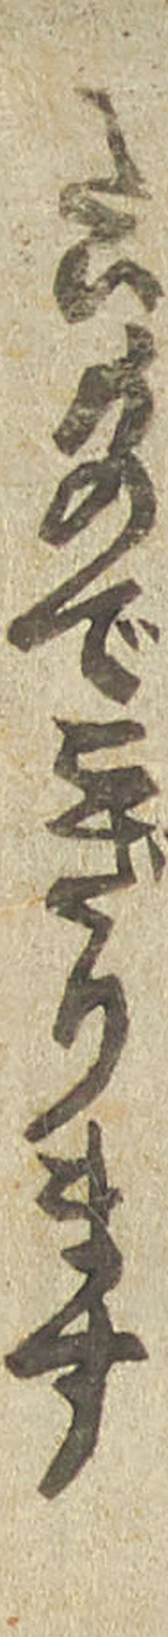たいものでこざります
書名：[病気鯰に諸職人見舞の図]
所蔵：東京大学総合図書館 General Library in the University of Tokyo, JAPAN
